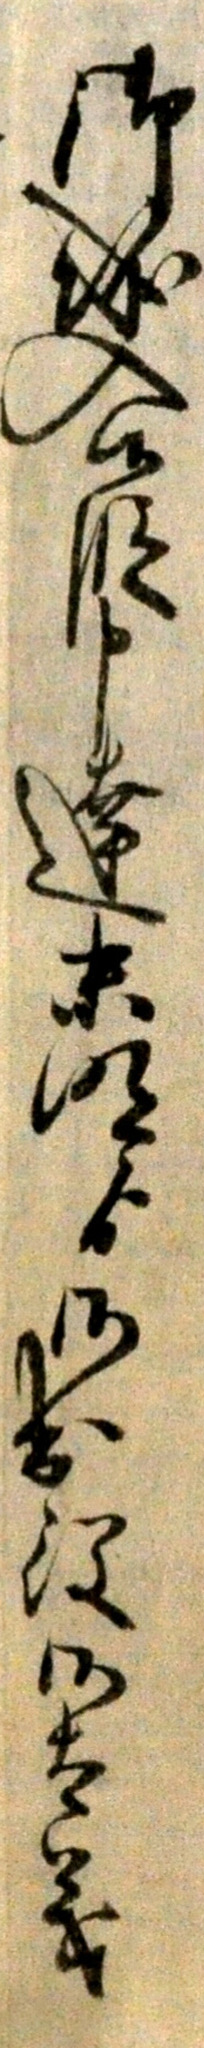御城入候段申達未明ゟ御出役御大義
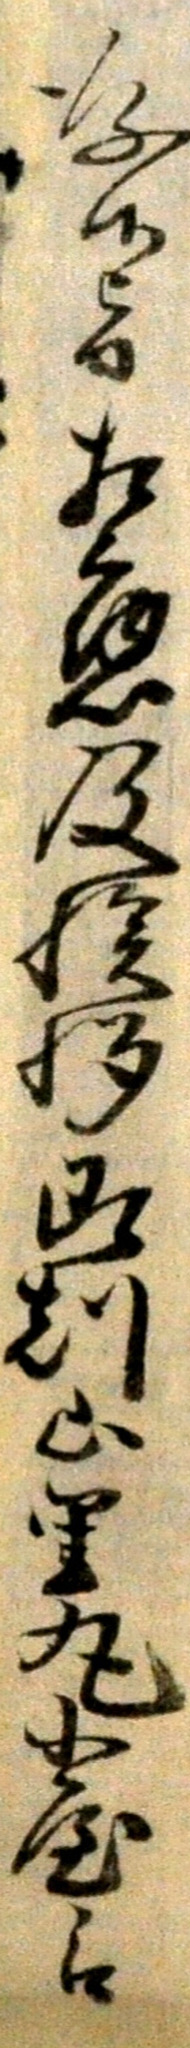存候旨相応及挨拶即刻山里丸小屋江
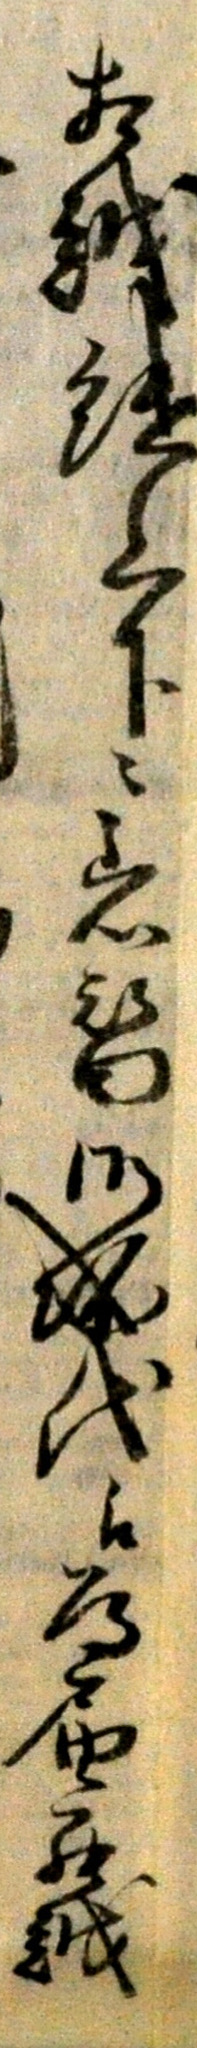相越継上下二着替御城代江為届罷越
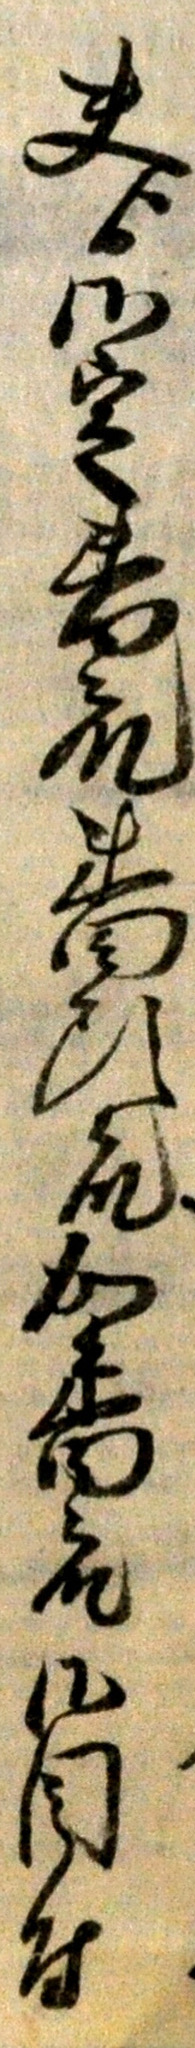夫ゟ御定番衆番頭衆加番衆御目付
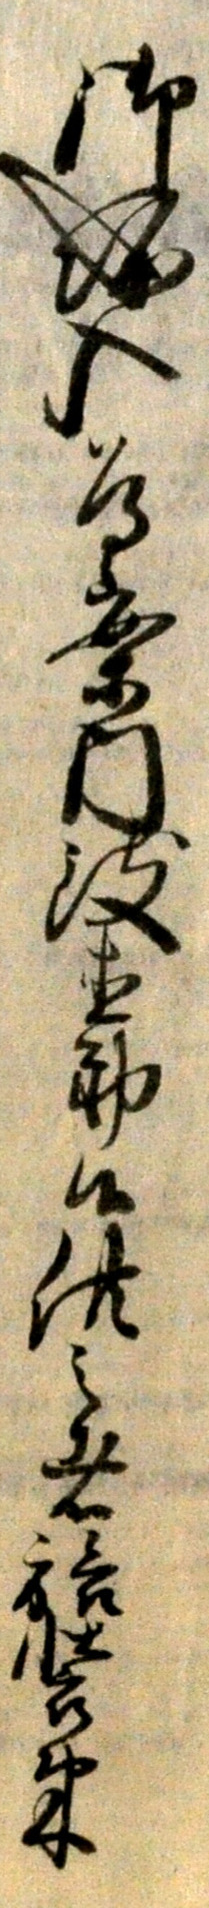御城入為案内致直勤候供之者旅装束
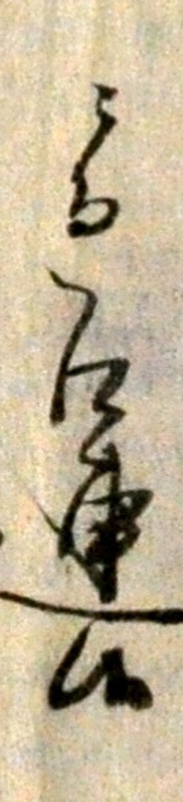ニ而召連候
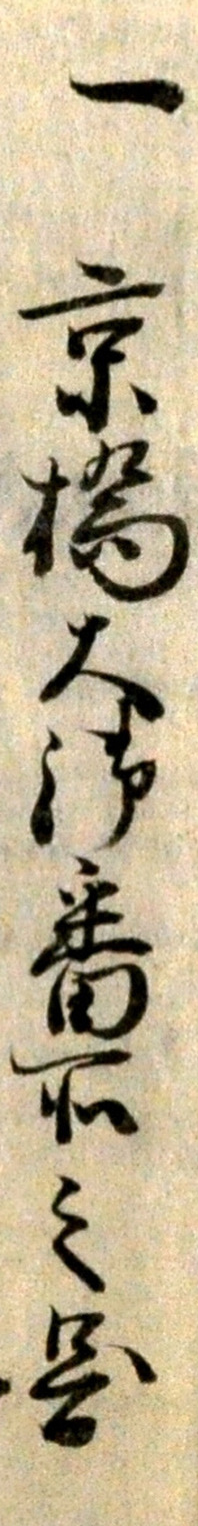一京橋大御番所之図

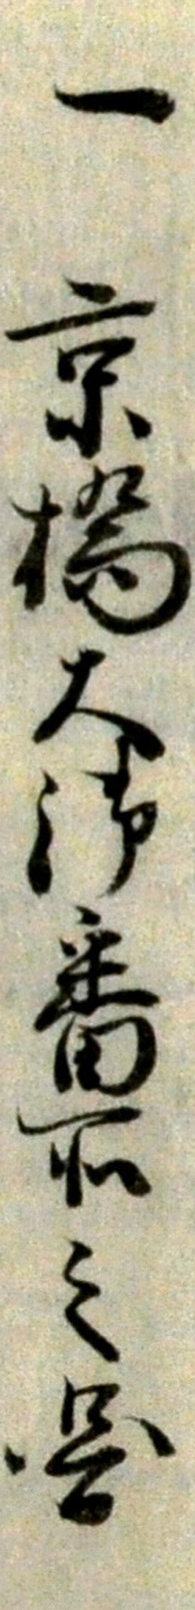一京橋大御番所之図

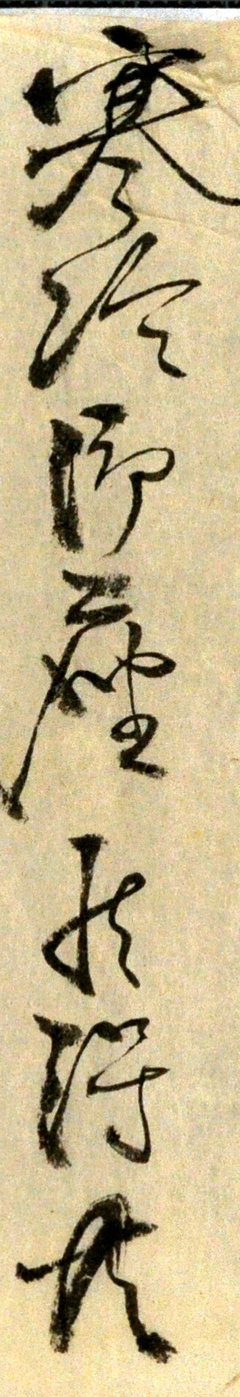寒冷御座候得共

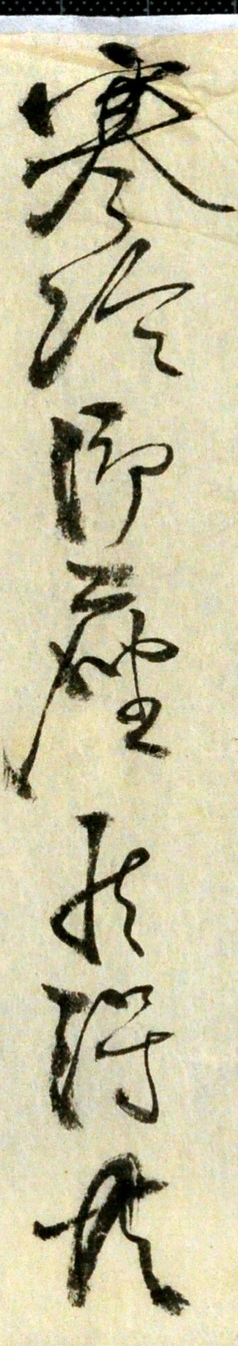寒冷御座候得共
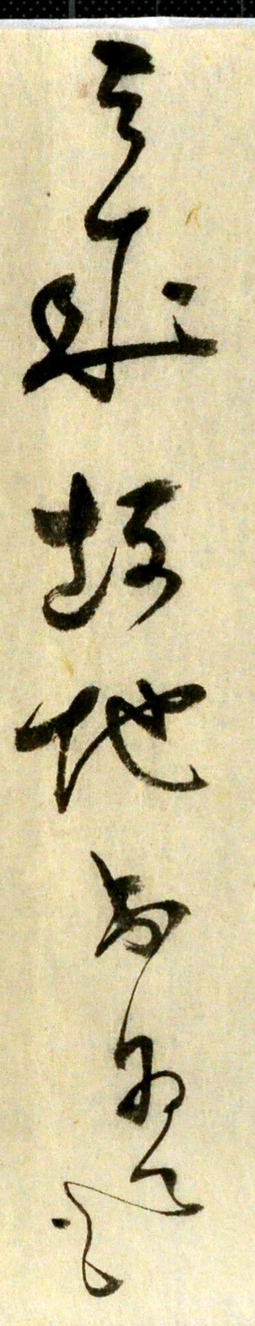被成坂地おゐても
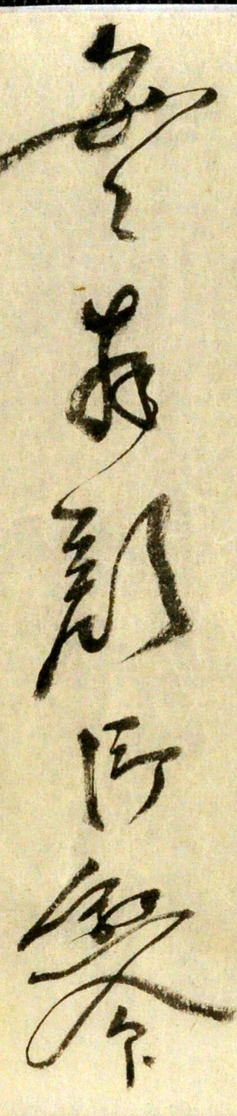毎々拝顔御懇命
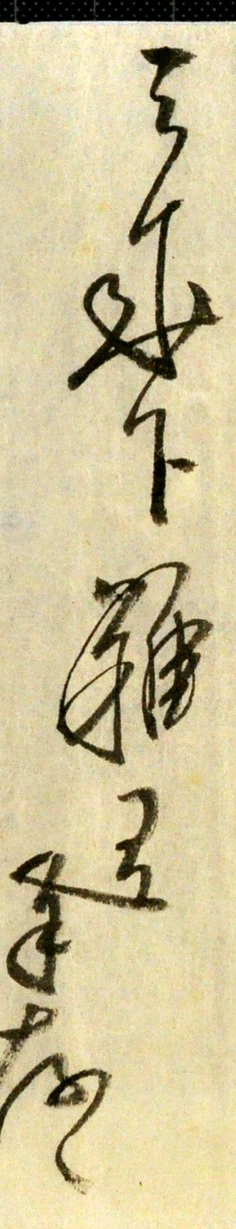被成下難有奉存候

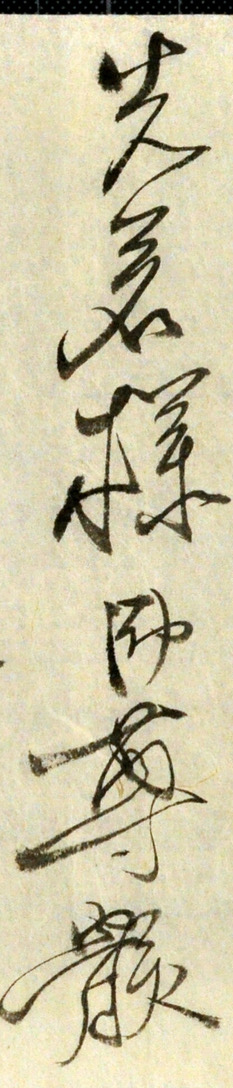先君様御尊骸
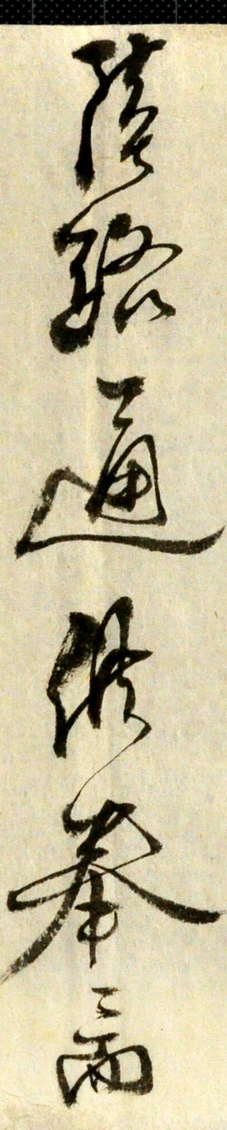陸路通供奉ニ而
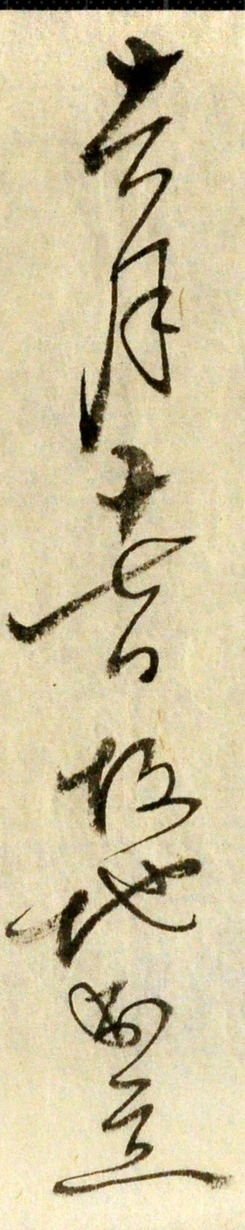去月十七日坂地出立
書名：大阪加番関係諸書留〔一括〕
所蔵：伊那市立高遠町図書館・合同会社AMANE
